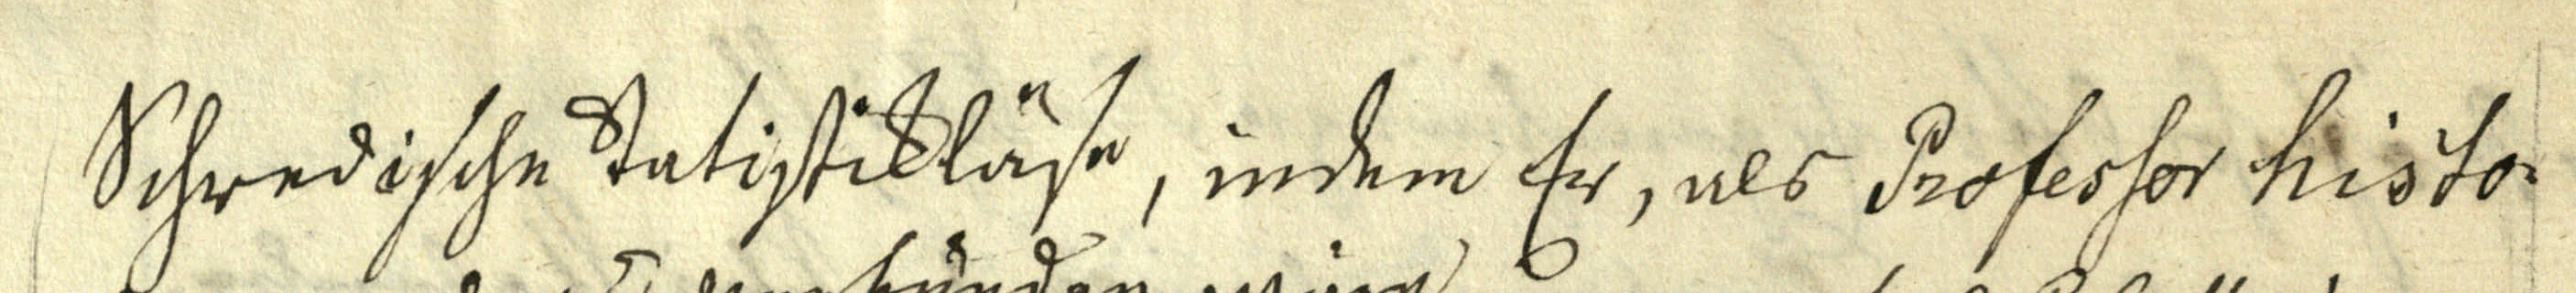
Schwedische Statistik läse, indem Er, als Profesor histo¬
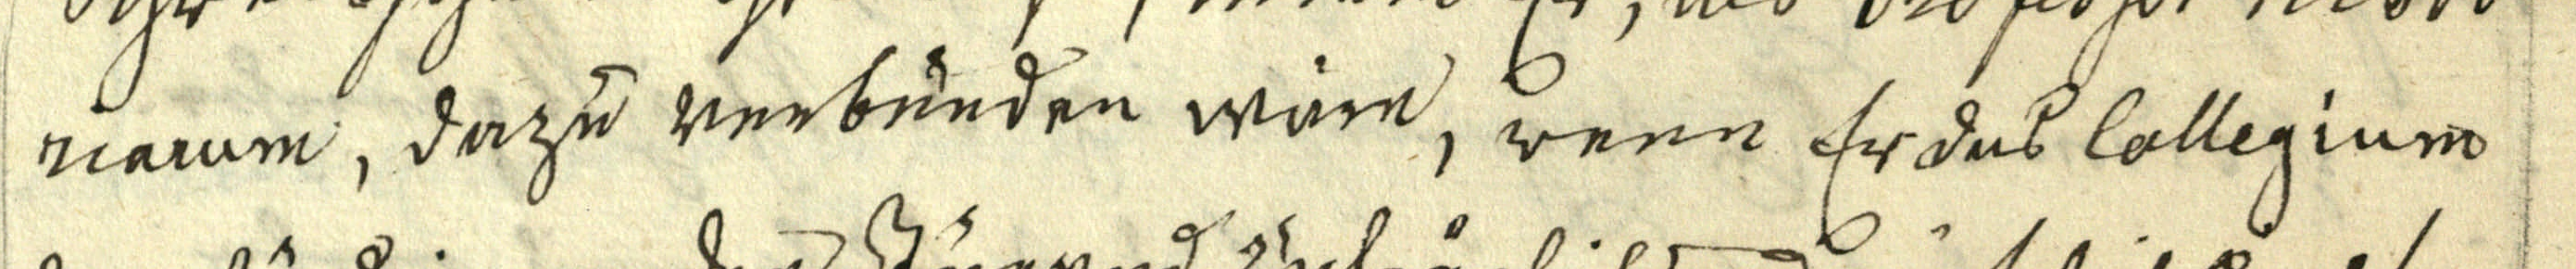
riarum, dazu verbunden wäre, wenn Er das Collegium
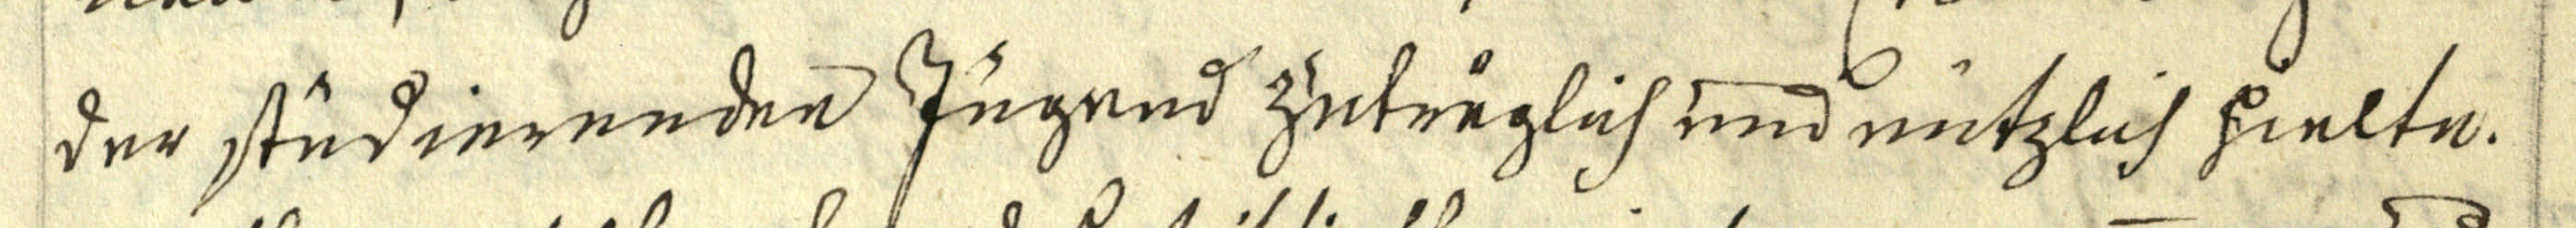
der studierenden Jugend zuträglich und nützlich hielte.
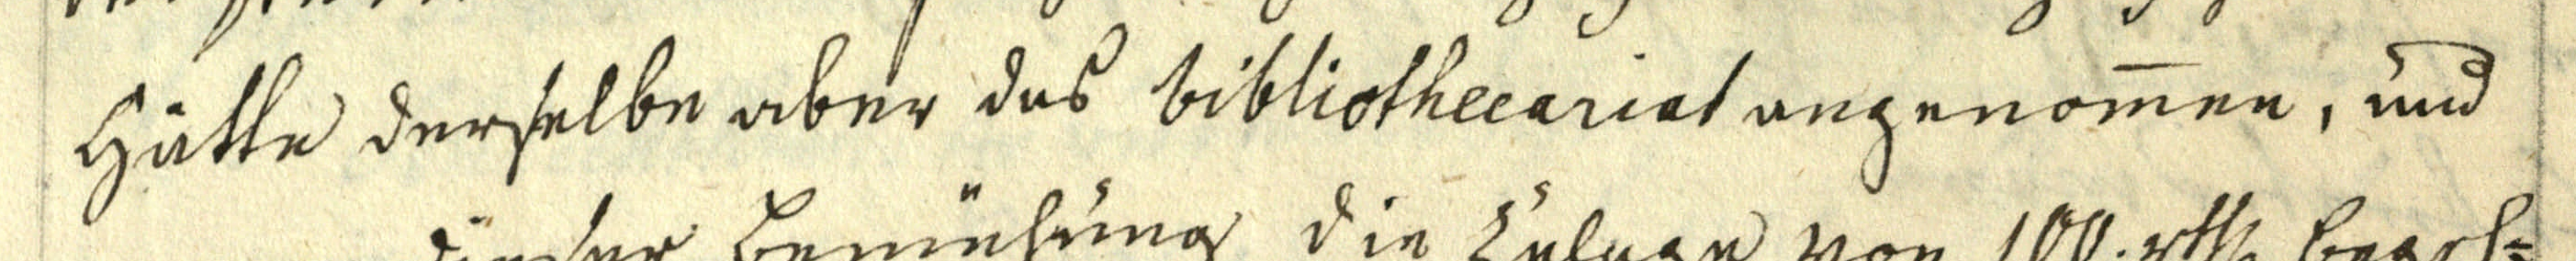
Hätte derselbe aber das Bibliothecariat angenomen, und
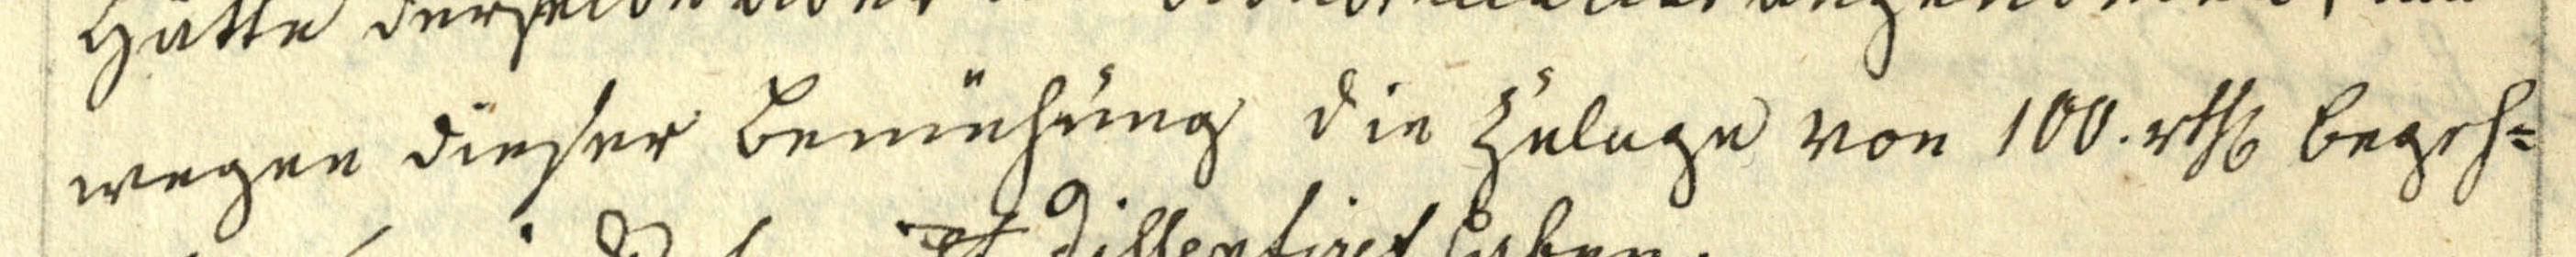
wegen dieser Bemühung die Zulage von 100. rth. begeh¬
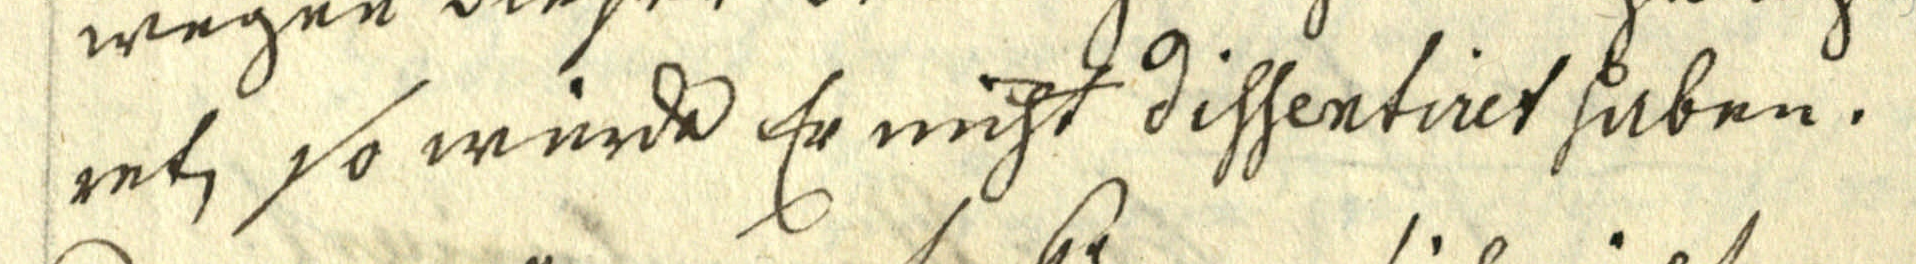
retin, so würde Er nicht dissentiret haben.
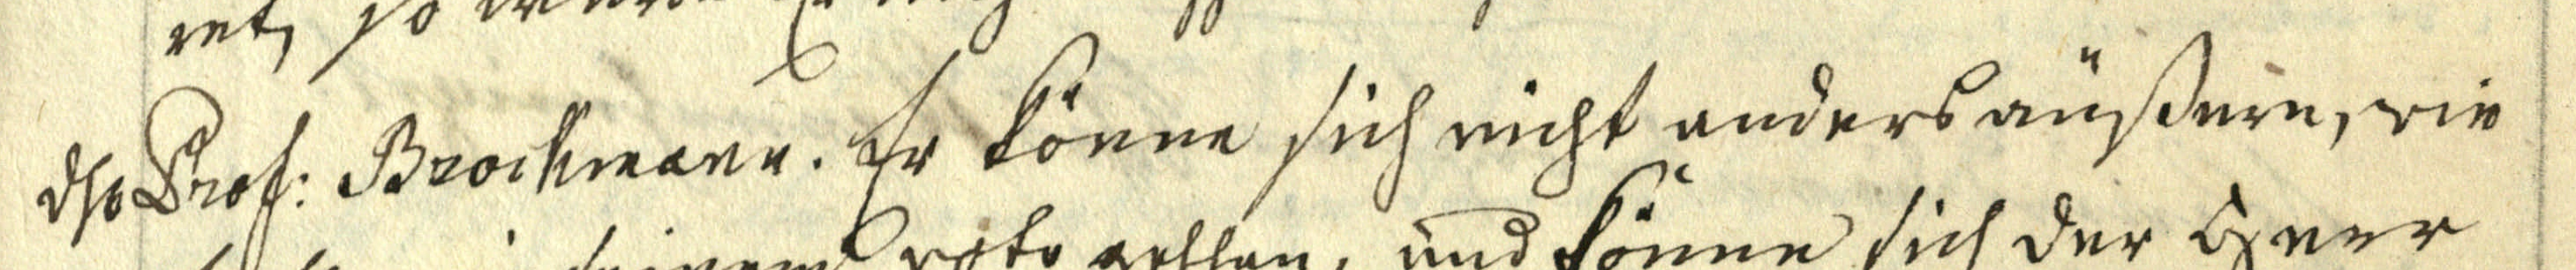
dh Prof. Brockmann. Er könne sich nicht anders äußern, wie
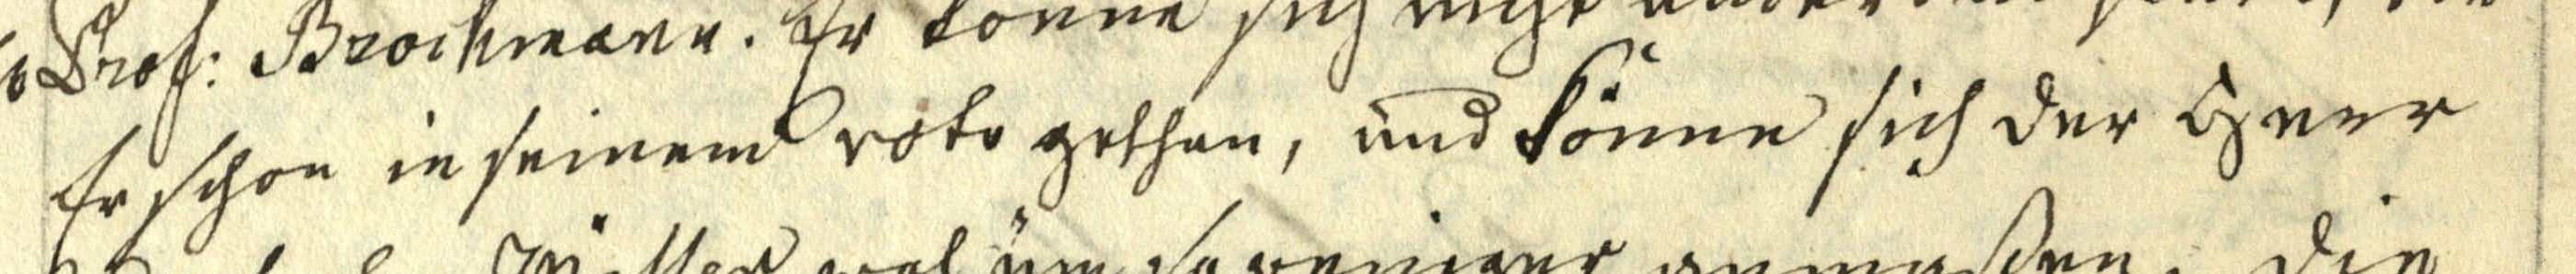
Er schon in seinem voto gethan, und könne sich der Herr
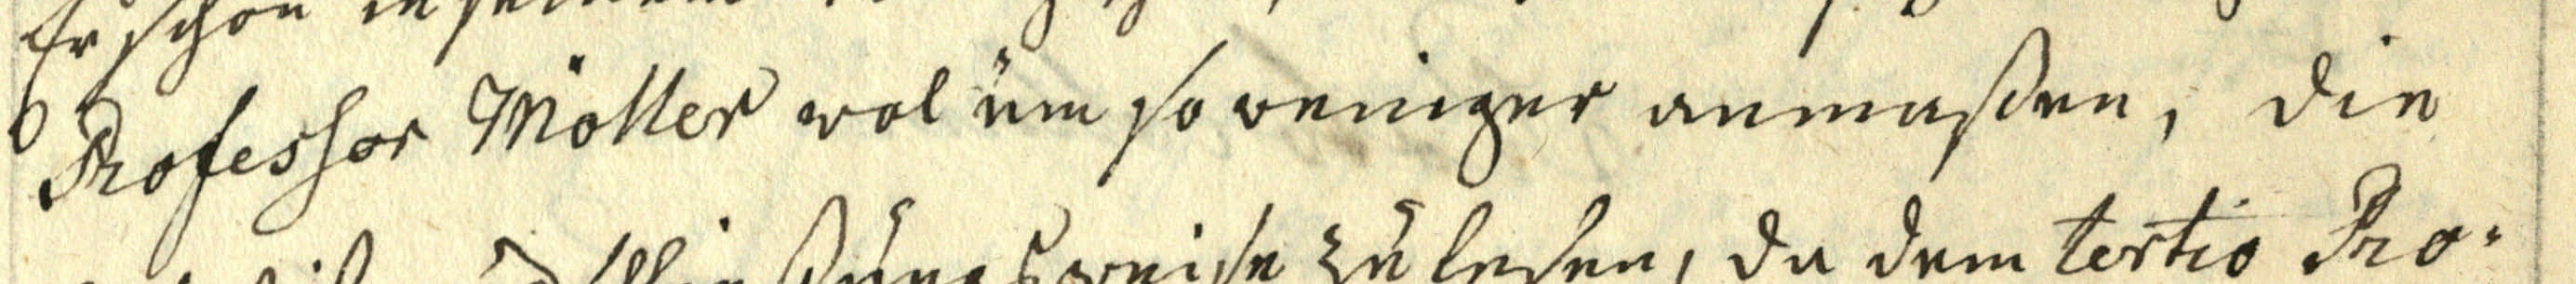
Professor Möller wol um so weniger anmaßen, die
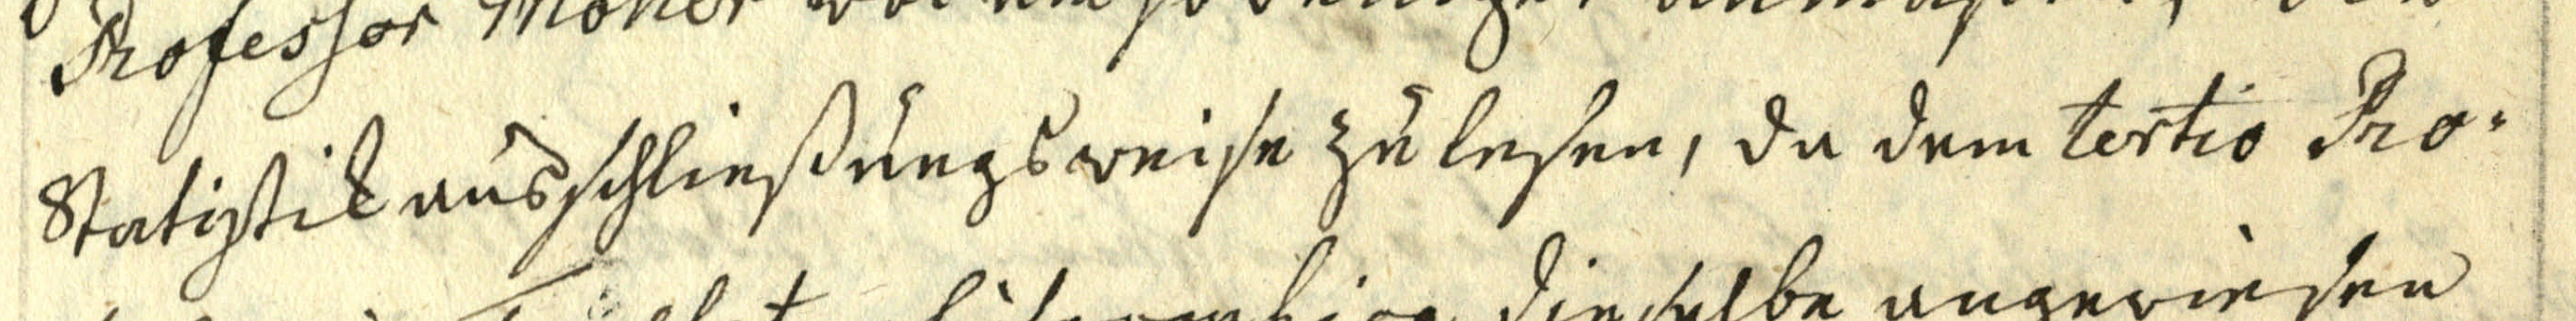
Statistik ausschließungs weise zu lesen, da dem tertio Pro¬
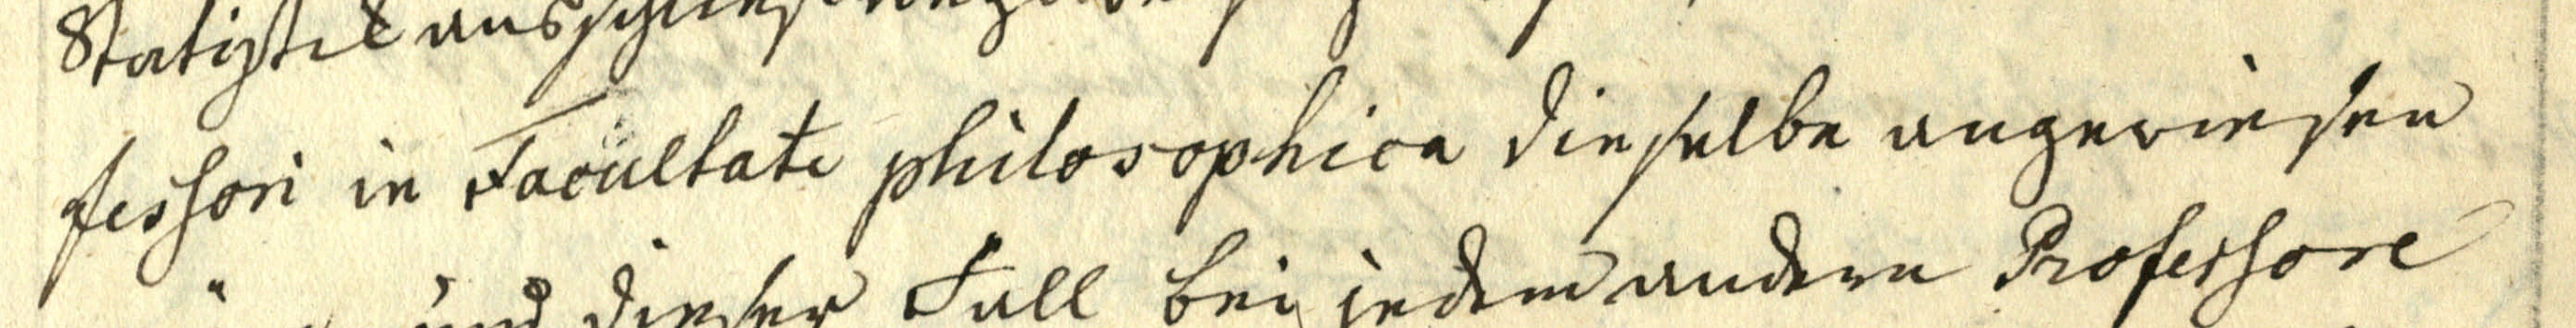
fessori in Facultate philosophica dieselbe angewiesen
